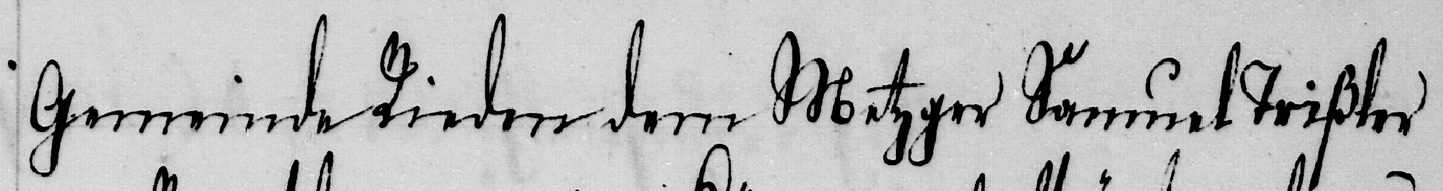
Gemeinde Rieden dem Metzger Samuel Trißler
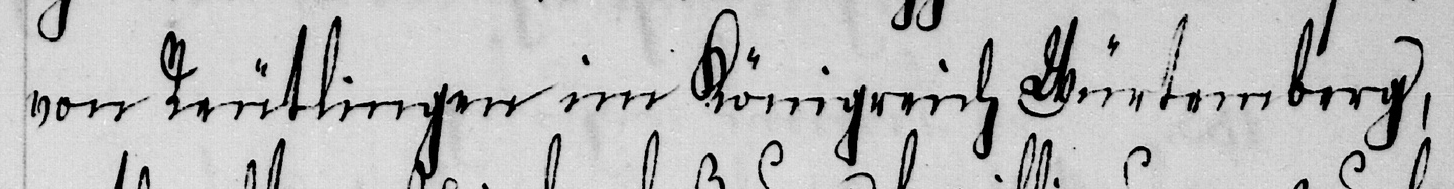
von Reutlingen im Königreich Würtemberg,
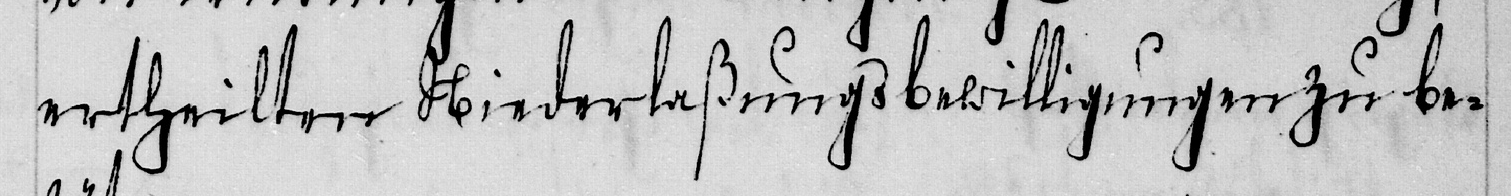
ertheilten Niederlaßungsbewilligungen zu be¬
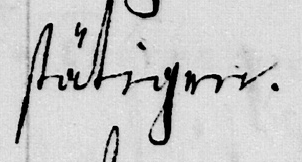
stätigen.
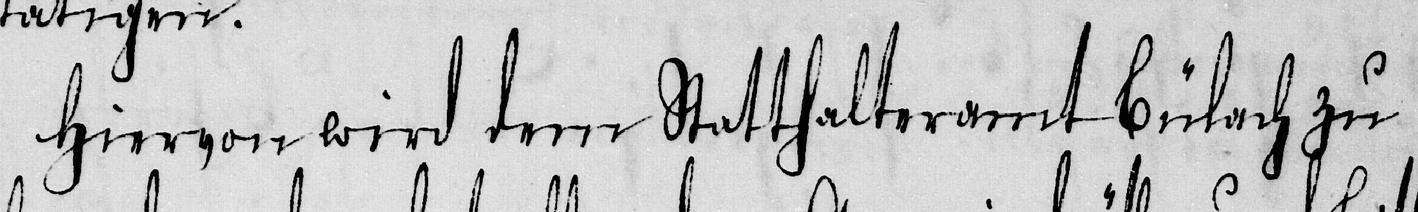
Hiervon wird dem Statthalteramt Bülach zu
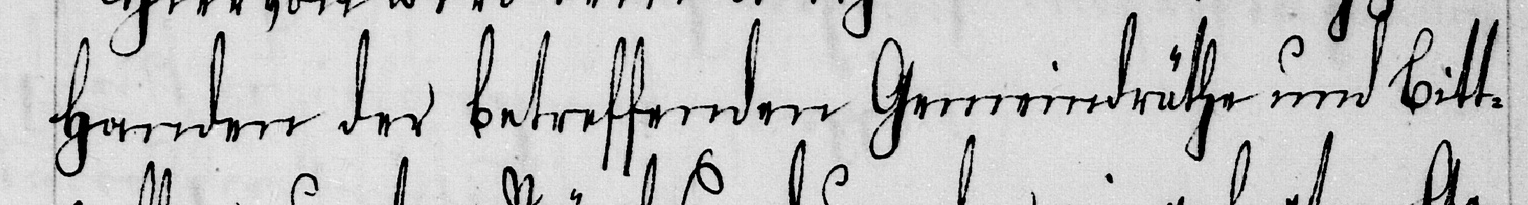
Handen der betreffenden Gemeindräthe und Bitt¬
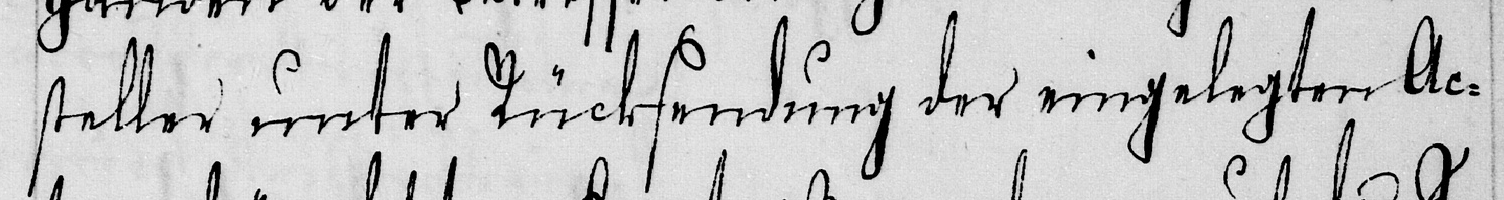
steller unter Rücksendung der eingelegten Ac¬
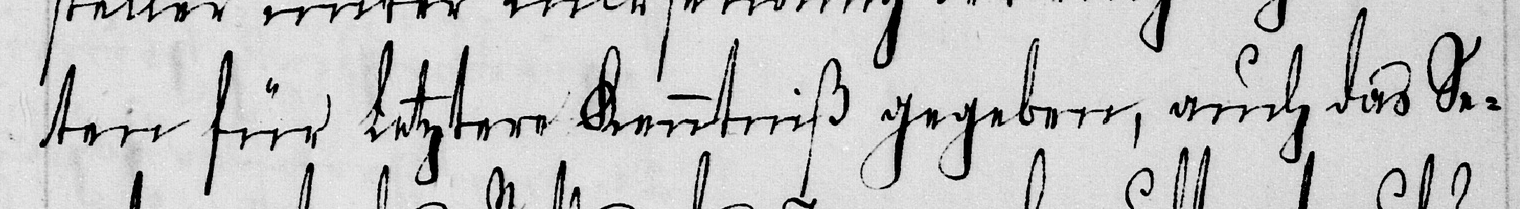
ten für Letztere Kenntniß gegeben, auch das Se¬
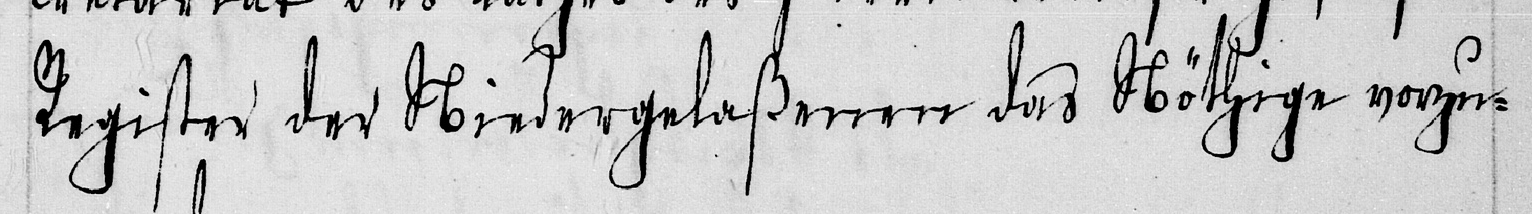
Register der Niedergelaßenen das Nöthige vorzu¬
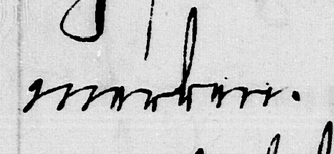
merken.
